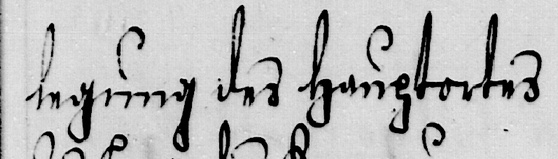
legung des Hauptortes
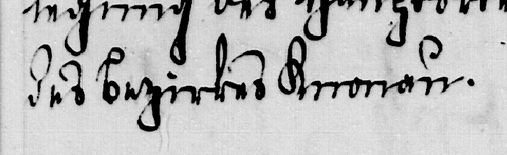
des Bezirkes Knonau.
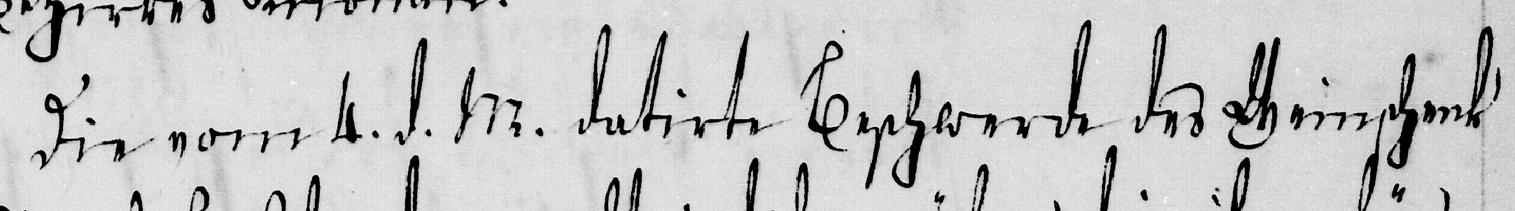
Die vom 4. d. M. datirte Beschwerde des Weinschenk
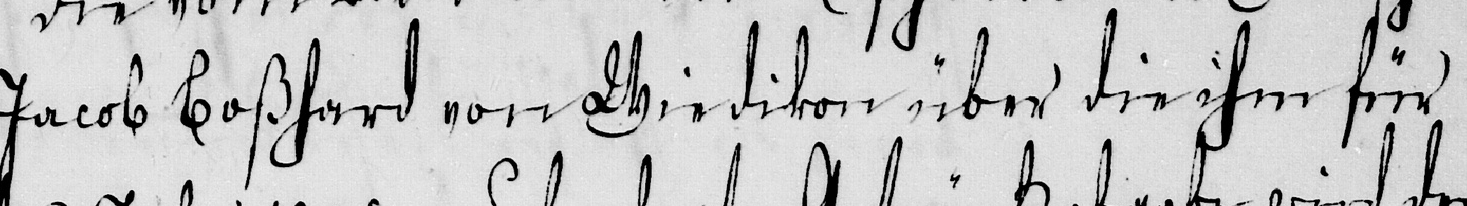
Jacob Boßhard von Wiedikon über die ihm für
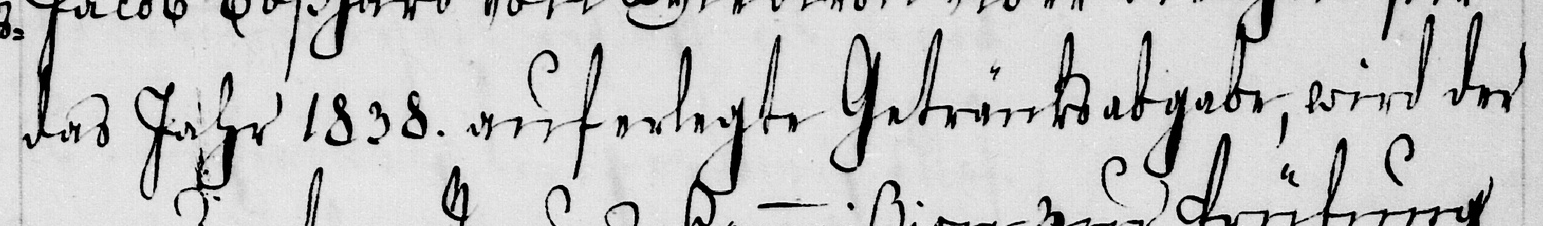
das Jahr 1838. auferlegte Getränksabgabe, wird der
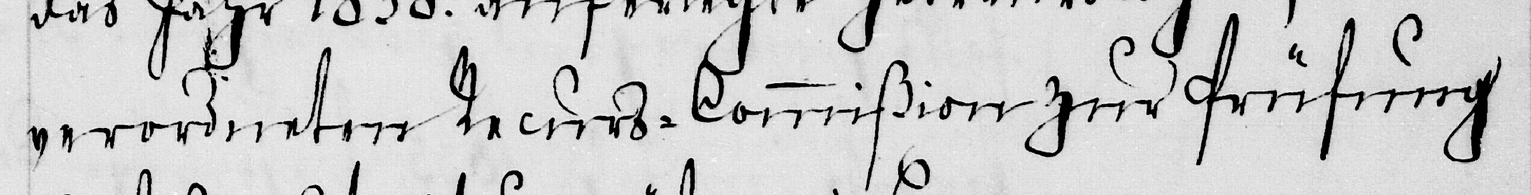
verordneten Recurs-Commißion zur Prüfung
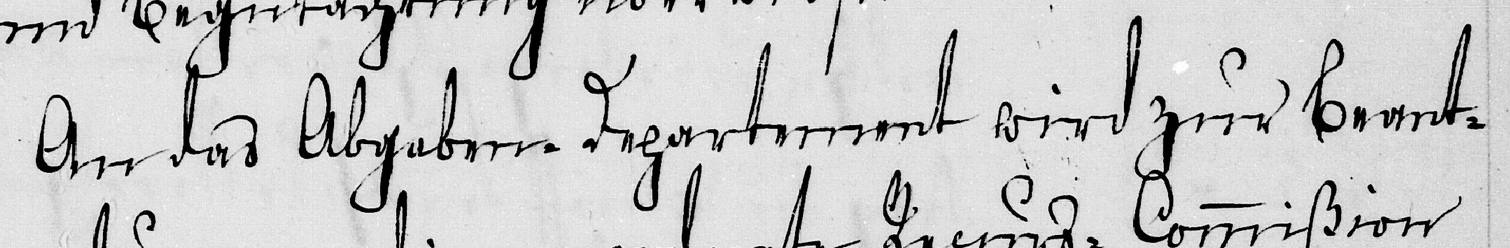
An das Abgaben-Departement wird zur Beant¬
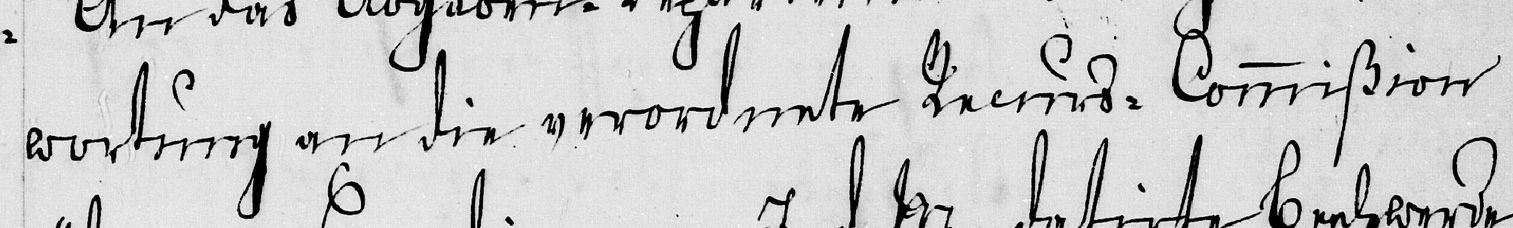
wortung an die verordnete Recurs-Commißion
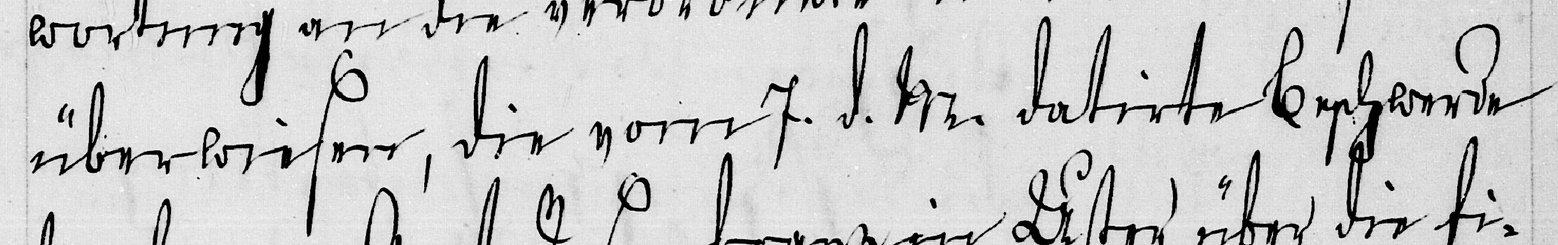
überwiesen, die vom 7. d. M. datirte Beschwerde
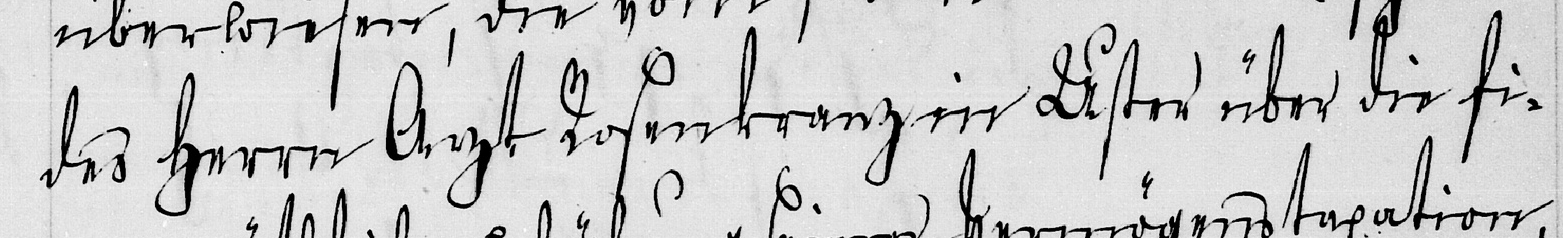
des Herrn Arzt Rosenkranz in Uster über die fi¬
